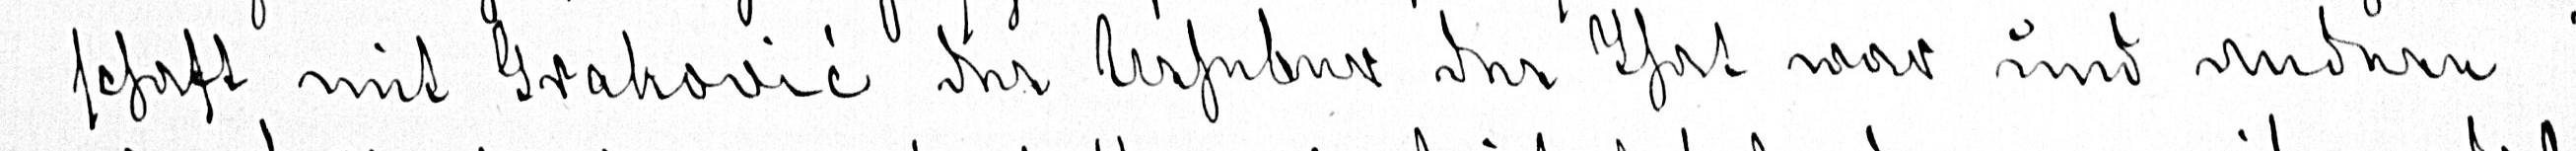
schaft mit Grahović der Urheber der That war und andere
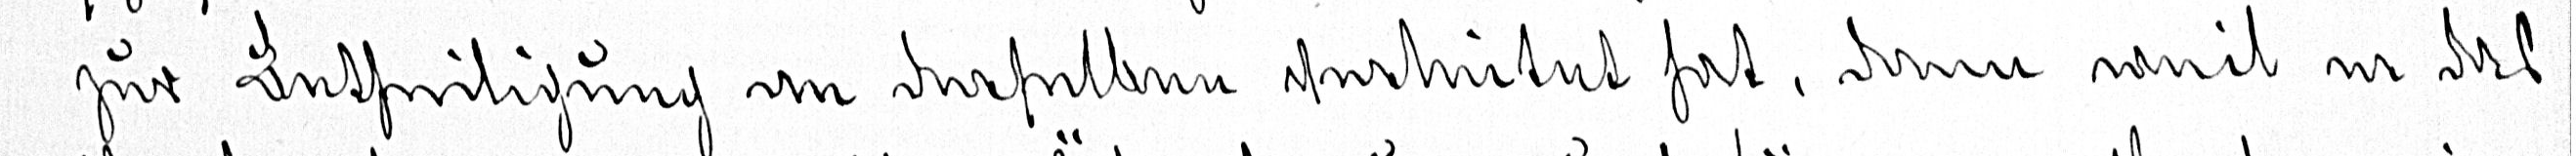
zur Betheiligung an derselben verleitet hat, dann weil er das
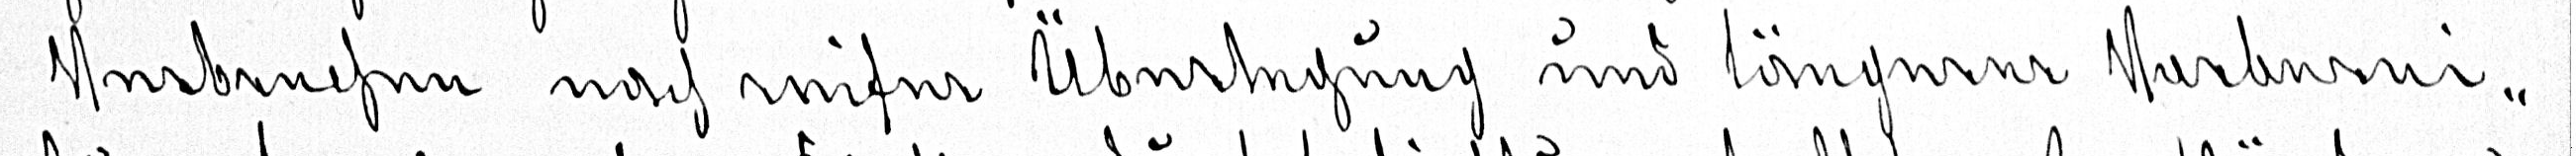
Verbrechen nach reifer Überlegung und längerer Vorberei¬
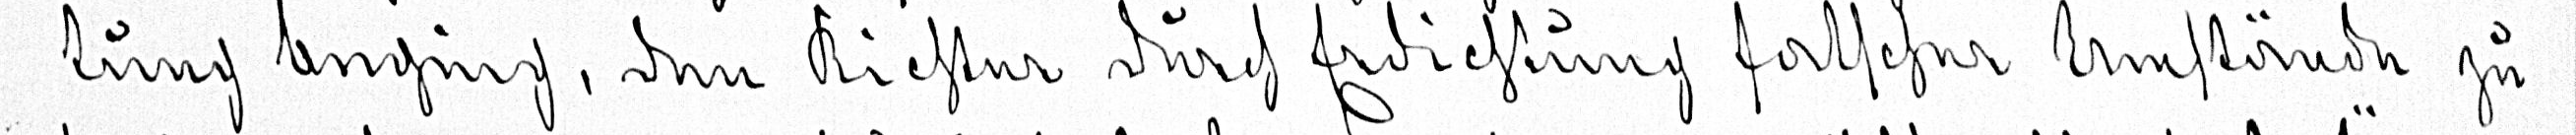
tung beging, den Richter durch Erdichtung falscher Umstände zu
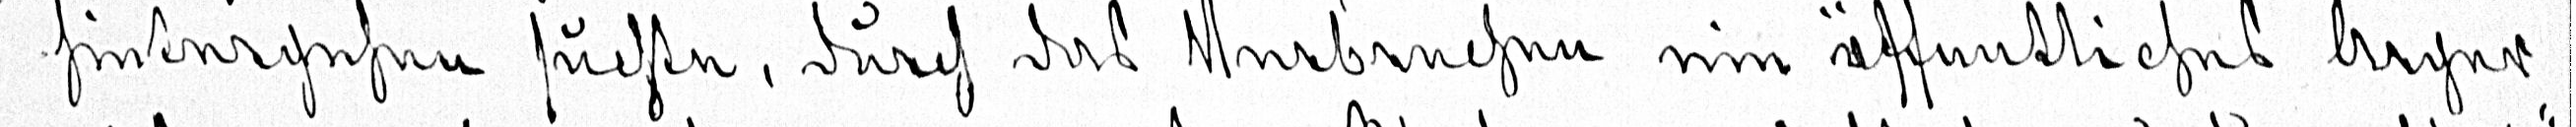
hintergehen suchte, durch das Verbrechen ein öffentliches Ärger¬
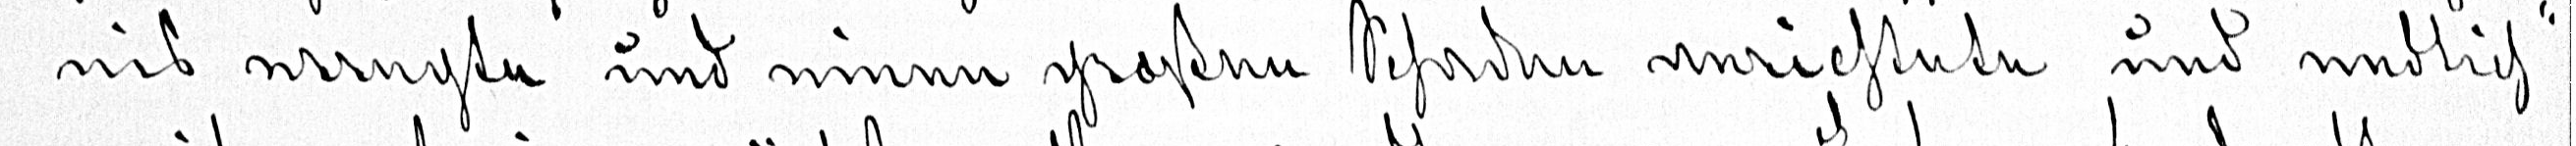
nis erregte und einen großen Schaden anrichtete und endlich
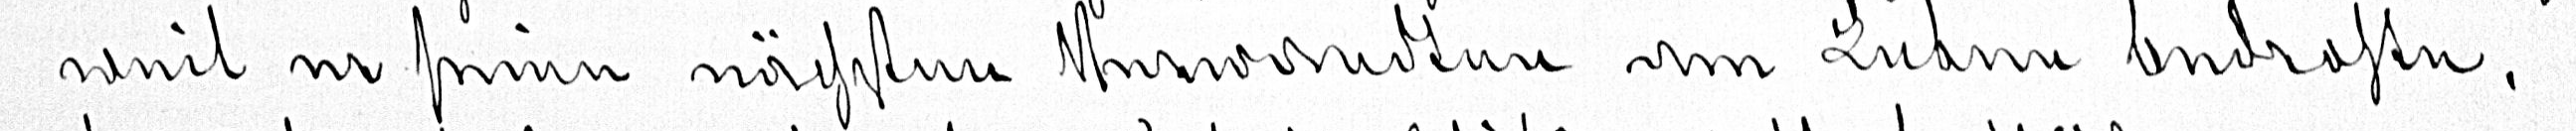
weil er seine nächsten Verwandten am Leben bedrohte,
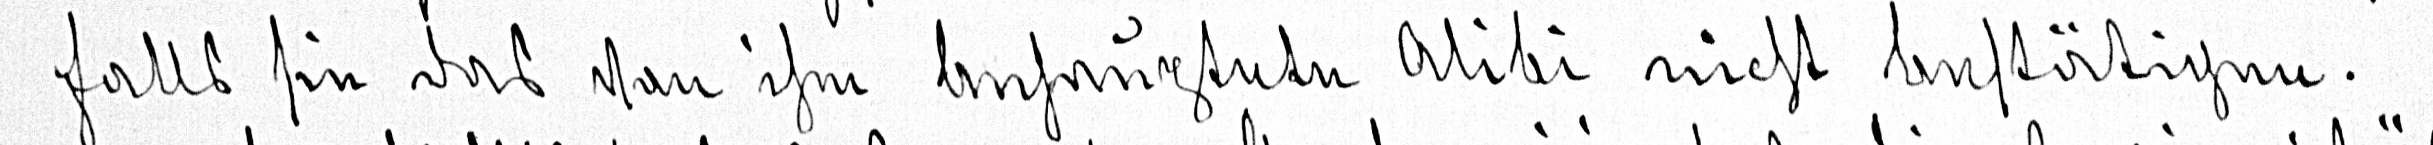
falls sie das von ihm behauptete Alibi nicht bestätigen.
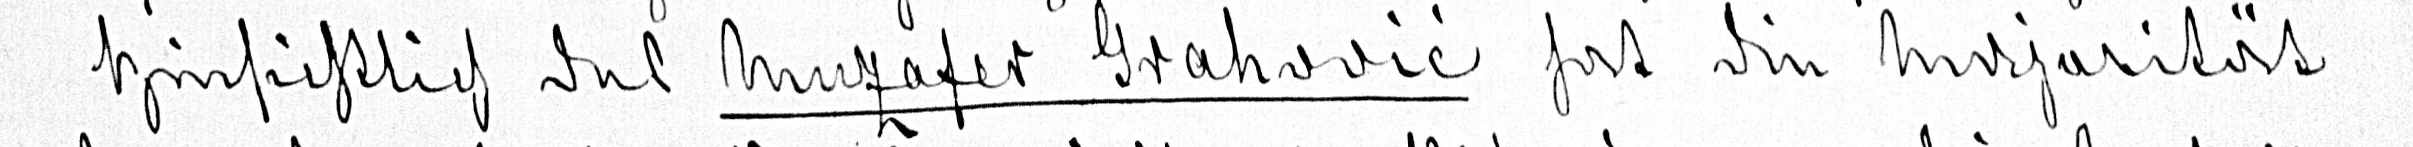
Hinsichtlich des Muzafer Grahović hat die Majorität
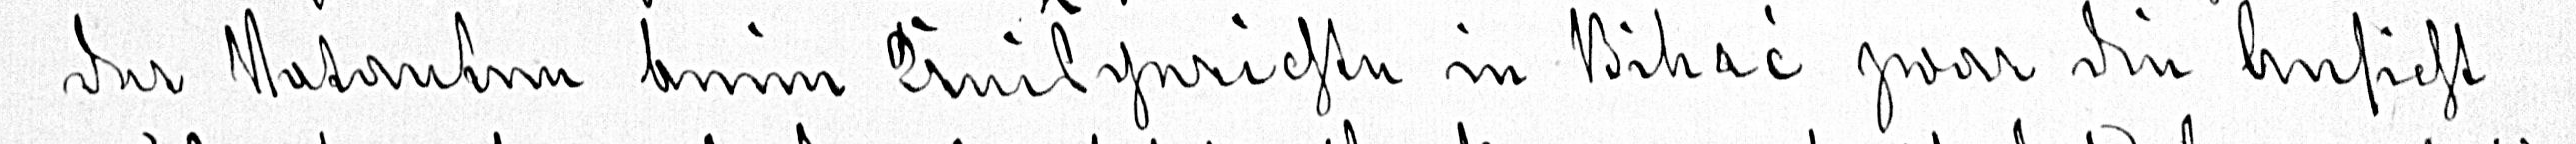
der Votanten beim Kreisgerichte in Bihać zwar die Ansicht
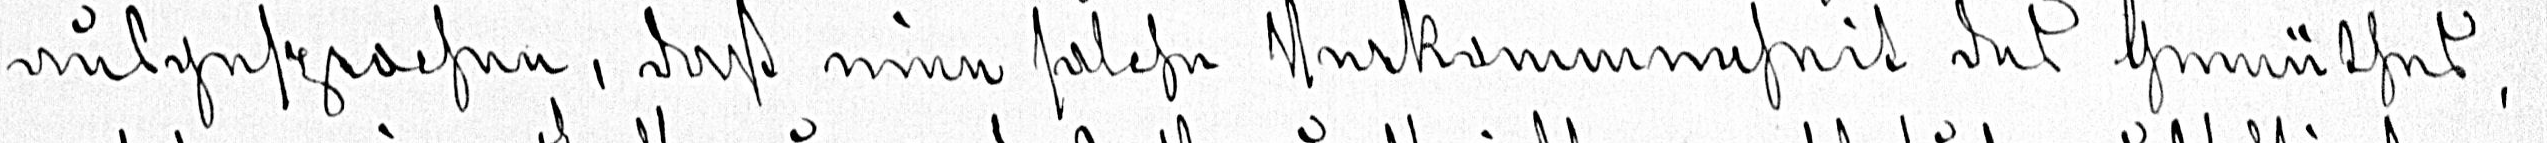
ausgesprochen, daß eine solche Verkommenheit des Gemüthes,
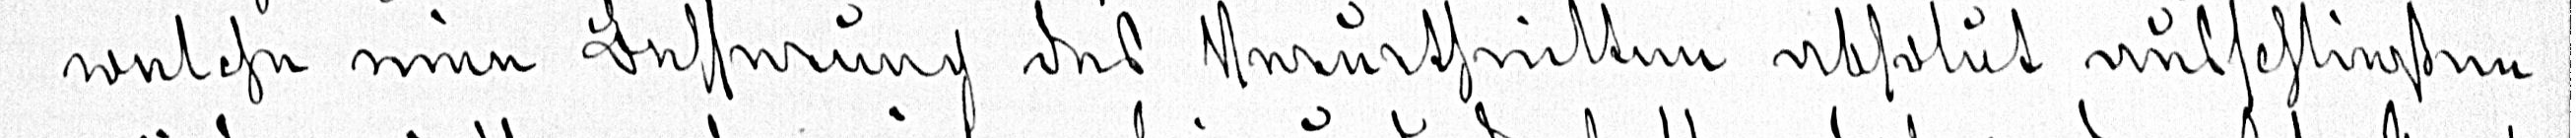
welche eine Besserung des Verurtheilten absolut ausschließen
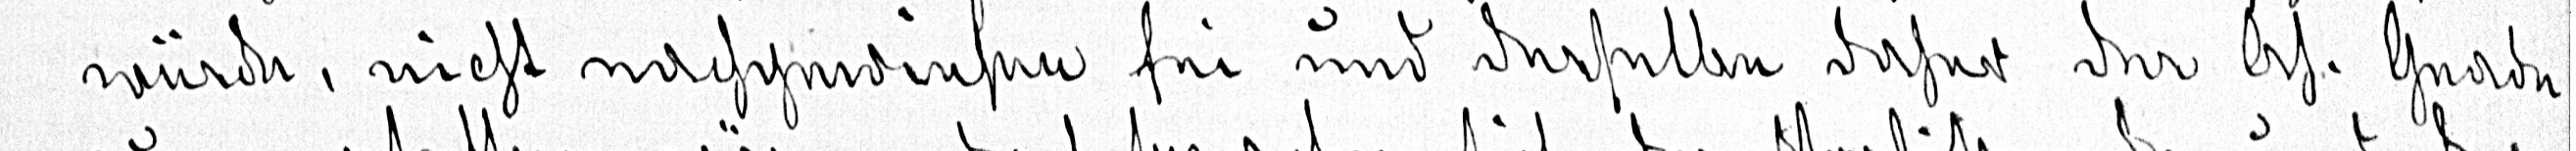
würde, nicht nachgewiesen sie und derselbe daher der Ah. Gnade
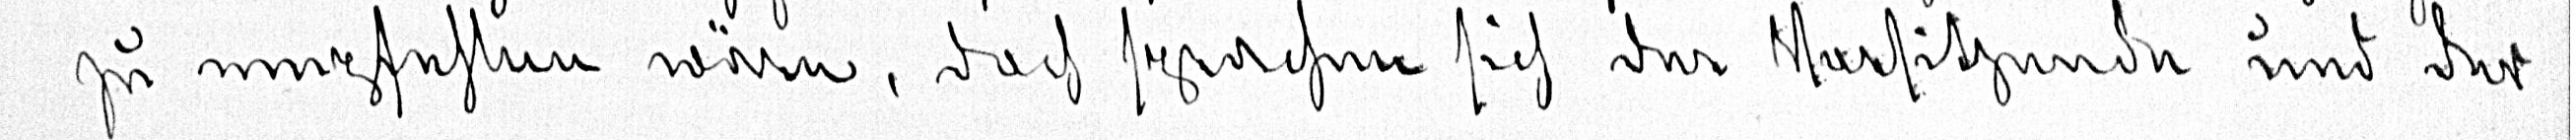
zu empfehlen wäre, doch sprachen sich der Vorsitzende und der
